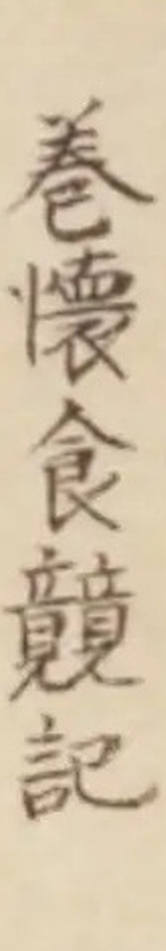巻懐食競記
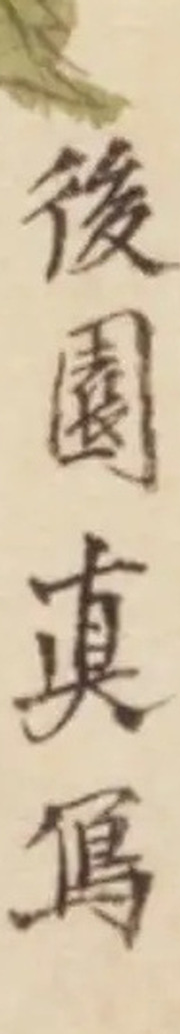後園真寫
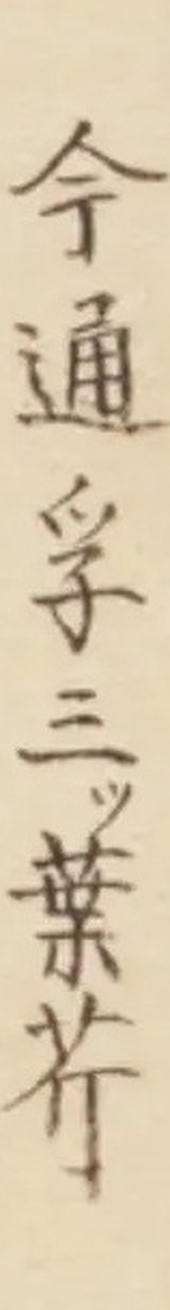今通字三ツ葉芹
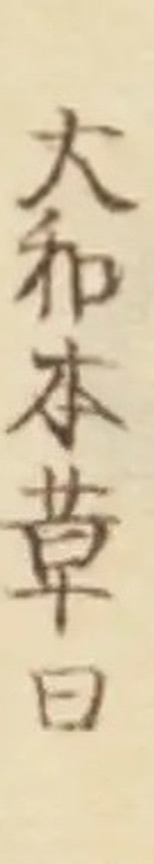大和本草曰
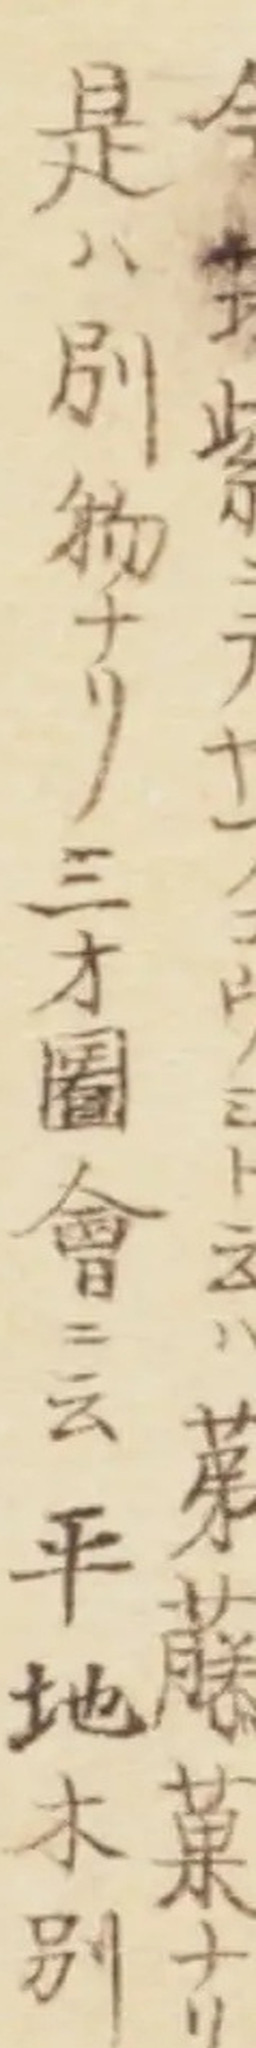是ハ別物ナリ三才圖會ニ云平地木別ニ
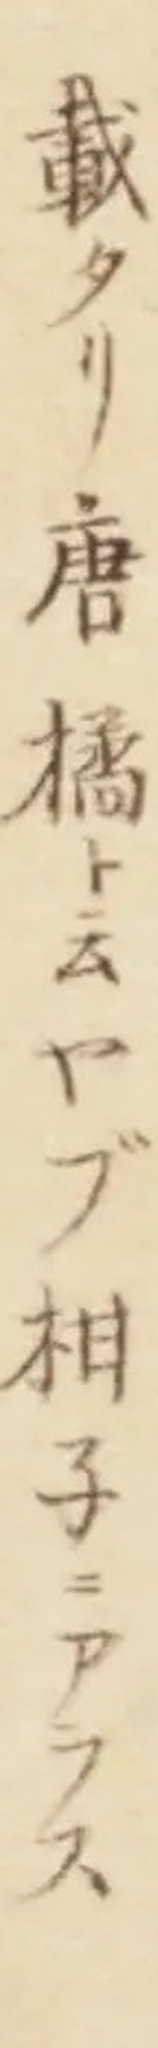載セタリ唐橘ト云ヤブ柑子ニアラス
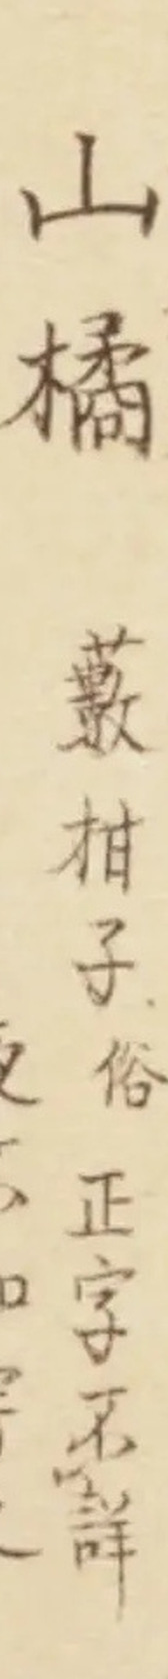山橘藪柑子俗正字不詳
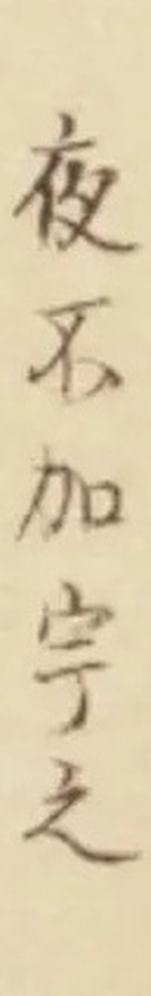夜不加宇之

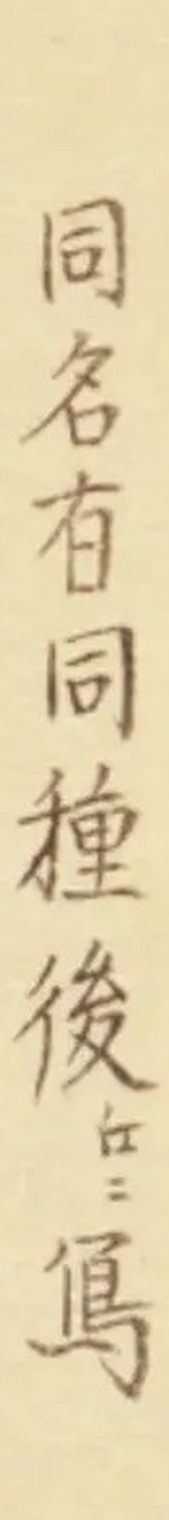同名有同種後ニ寫
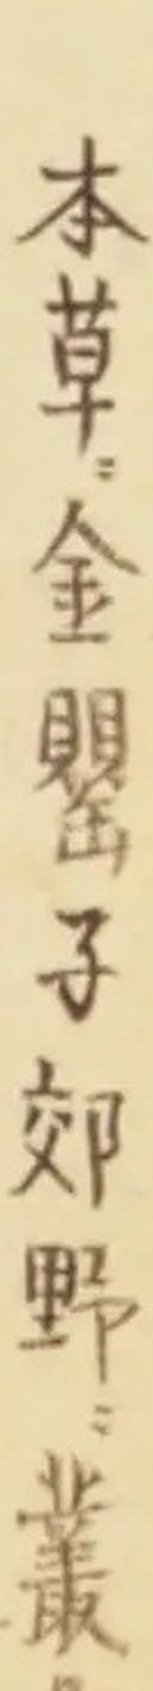本草ニ金罌子郊野ニ叢生ス
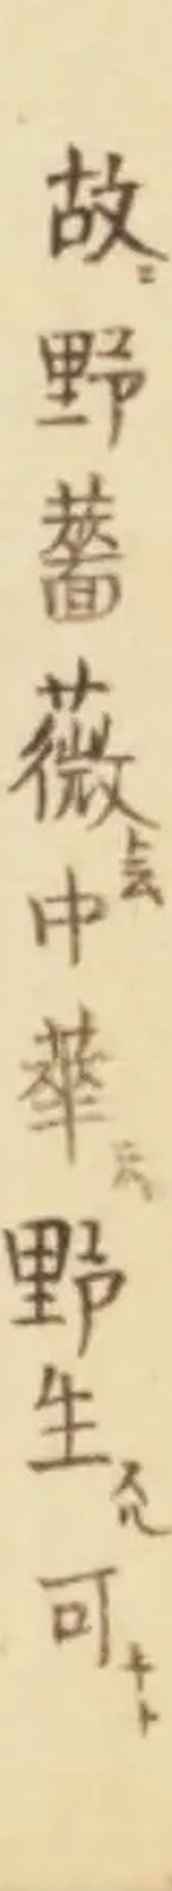故ニ野薔薇ト云中華ニハ野生スル可キト
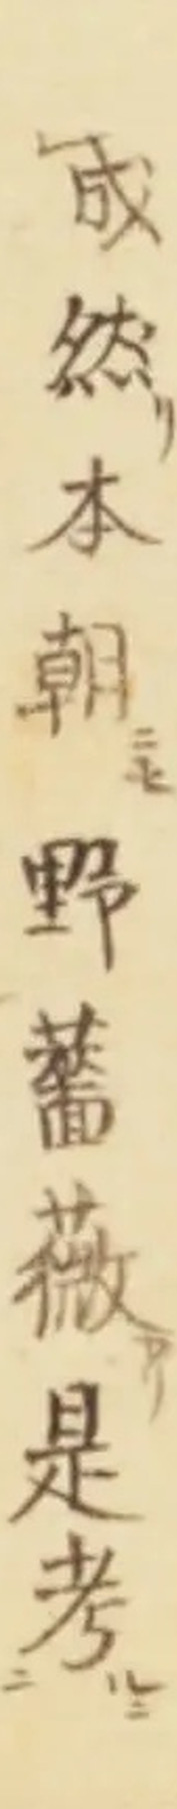成然リ本朝ニモ野薔薇アリ是考ルニ
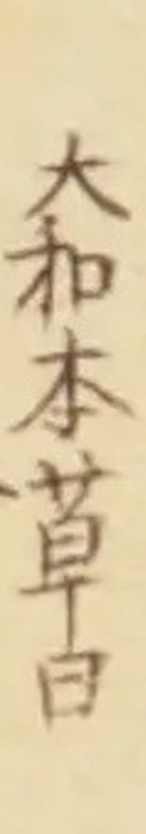大和本草曰
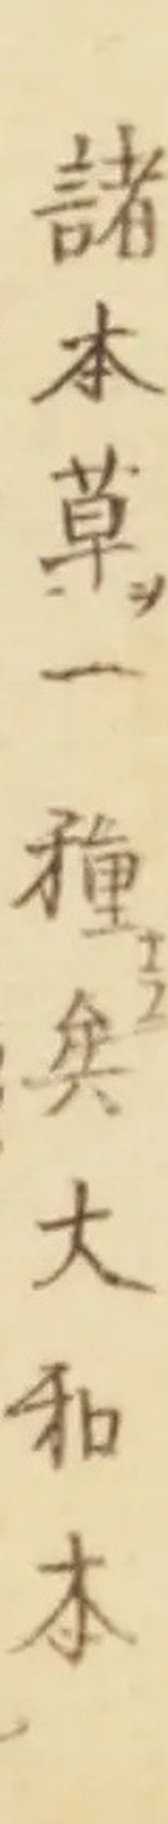諸本草ヲ一種ナラン矣大和本
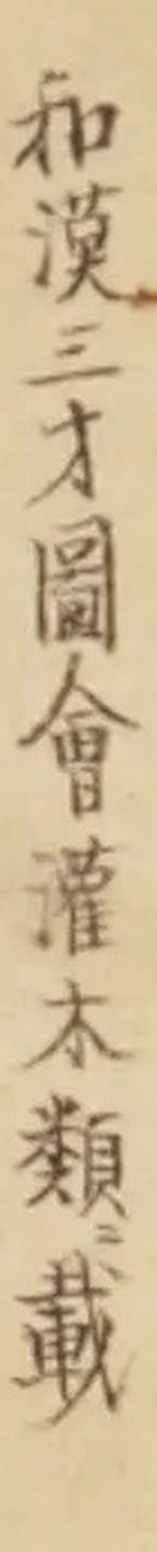和漢三才圖會灌木類ニ曰
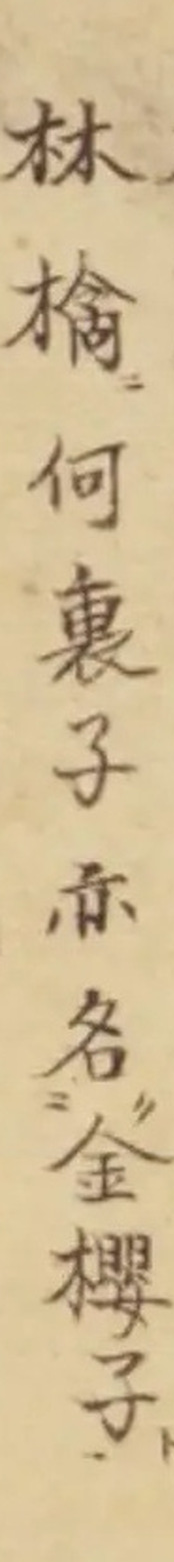林檎ニ何裏子亦名金櫻子ト
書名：梅園草木花譜夏之部. 1
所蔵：国立国会図書館 National Diet Library, JAPAN
